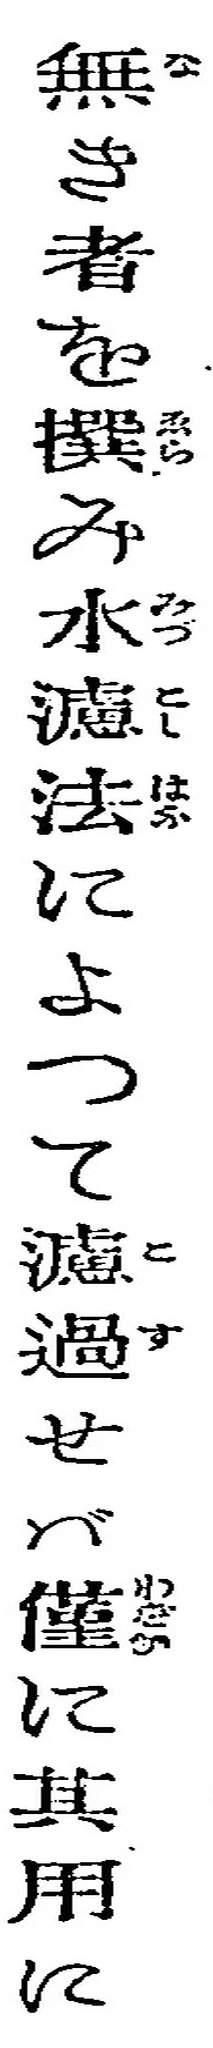無き者を撰み水濾法によつて濾過せば僅に其用に
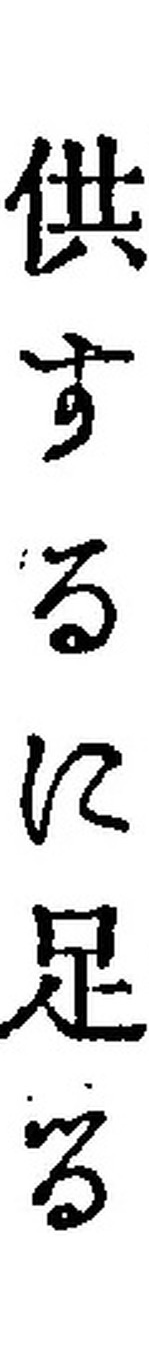供するに足る
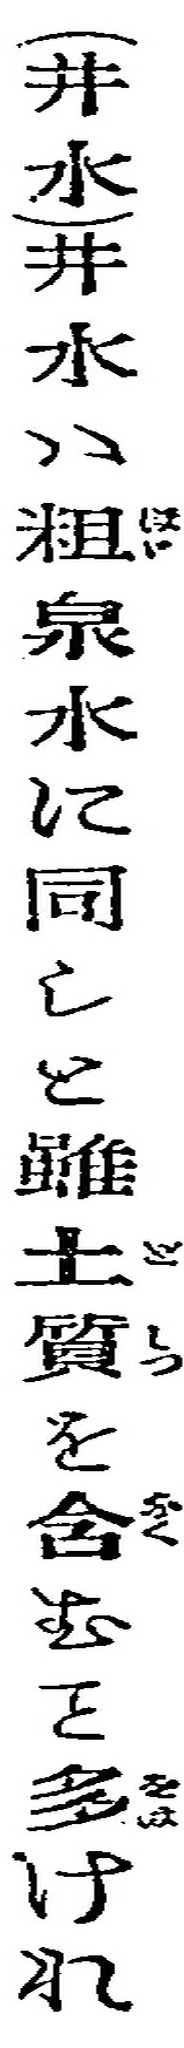[井水]井水は粗泉水に同しと雖土質を含むこと多けれ
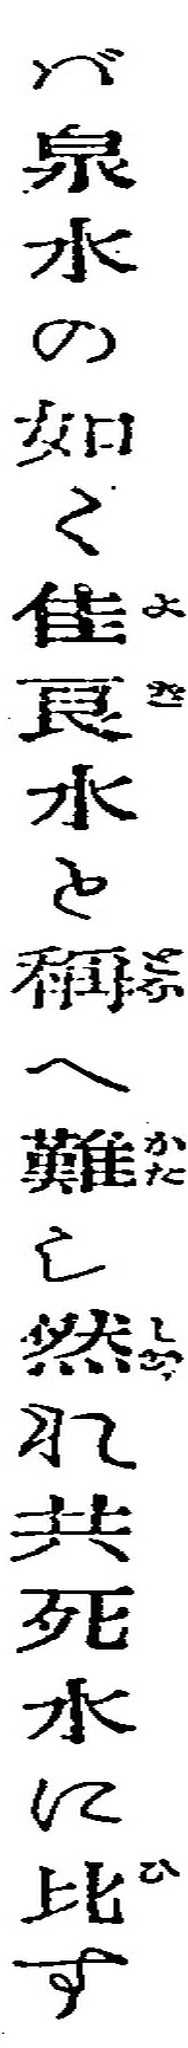ば泉水の如く佳良水と稱へ難し然れ共死水に比す
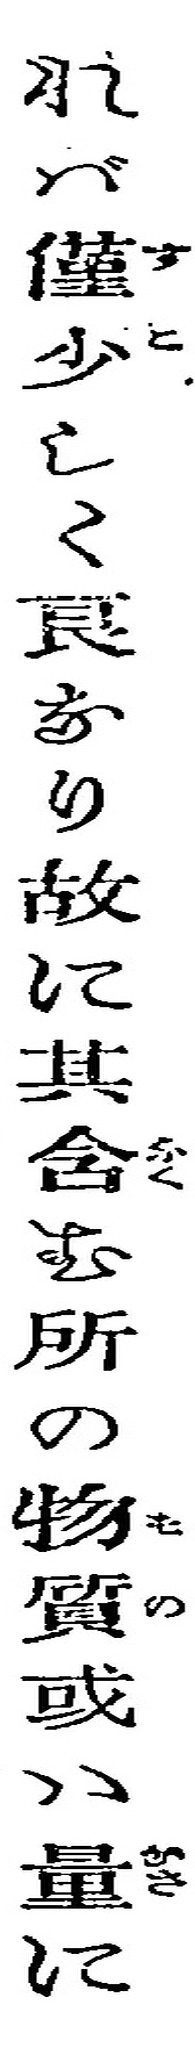れば僅少しく良なり故に其含む所の物質或は量に
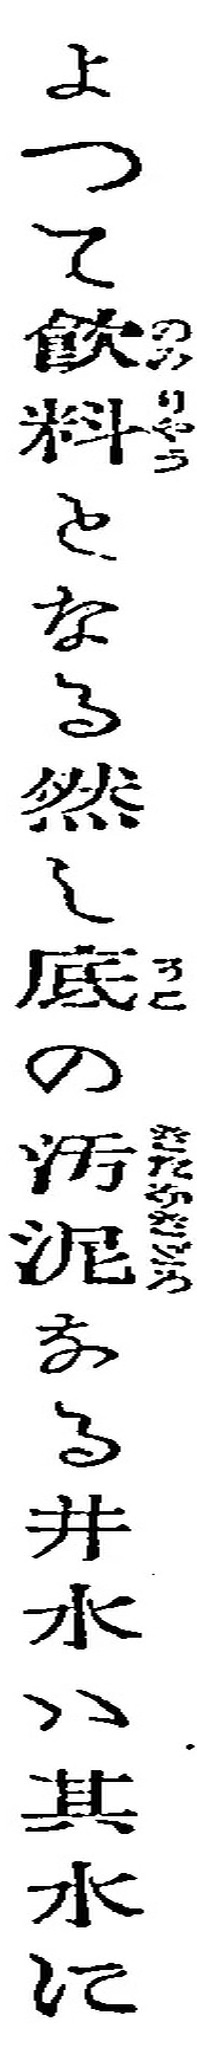よつて飲料となる然し底の汚泥なる井水は其水に
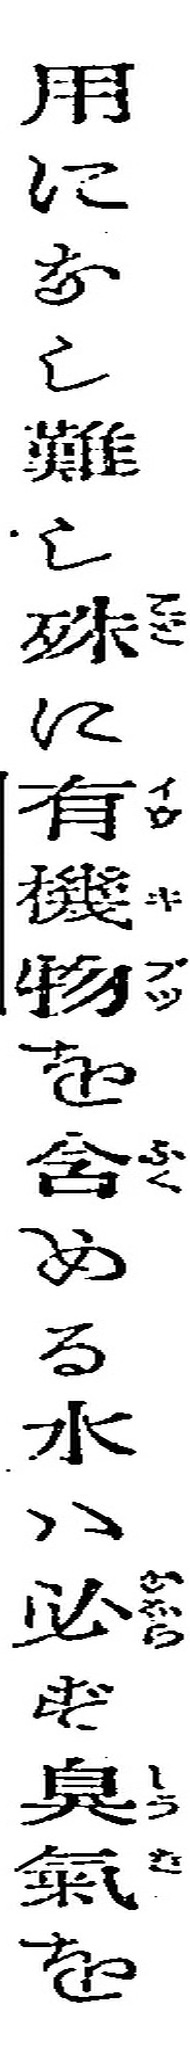用になし難し殊に有機物を含める水は必ず臭気を
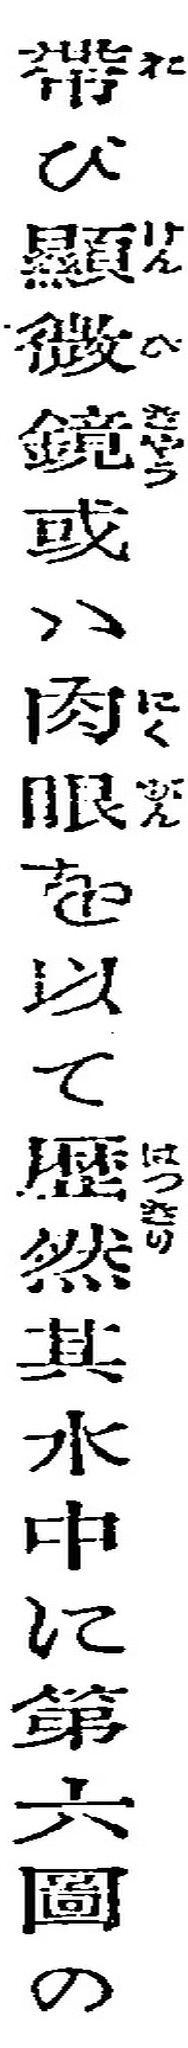帯び顕微鏡或は肉眼を以て歴然其水中に第六圖の
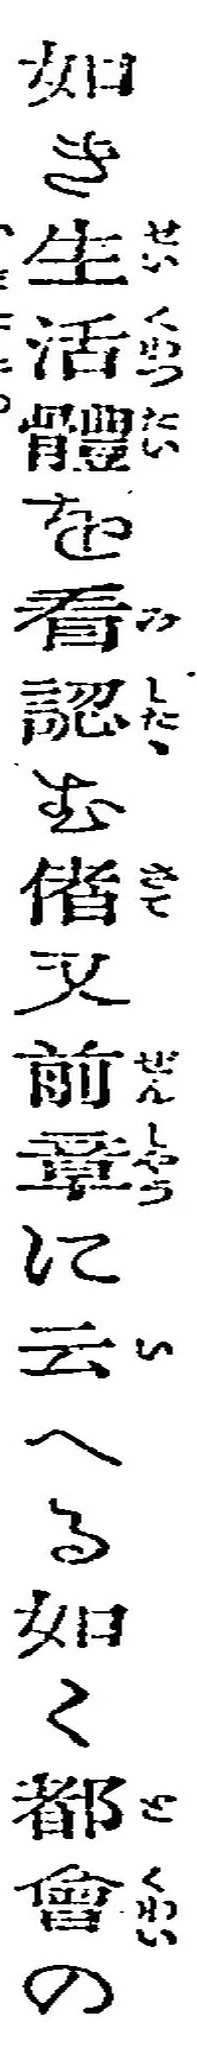如き生活體を看認偖又前章に云へる如く都會の
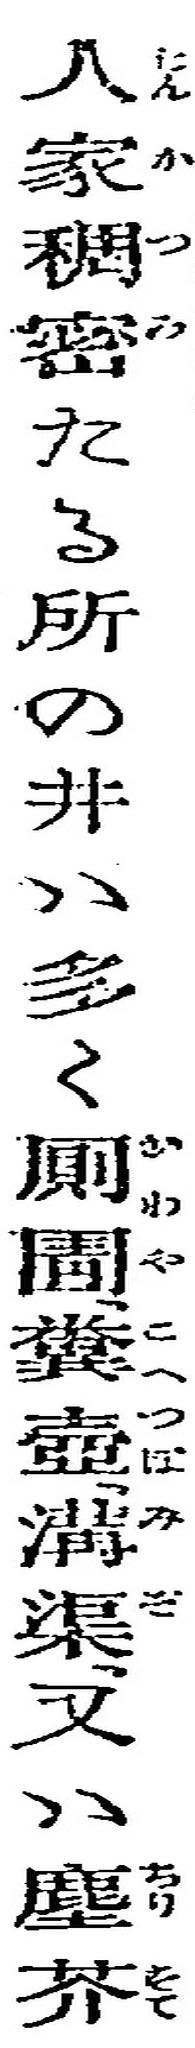人家稠密たる所の井は多く厠圊、糞壺、溝渠、又は塵芥

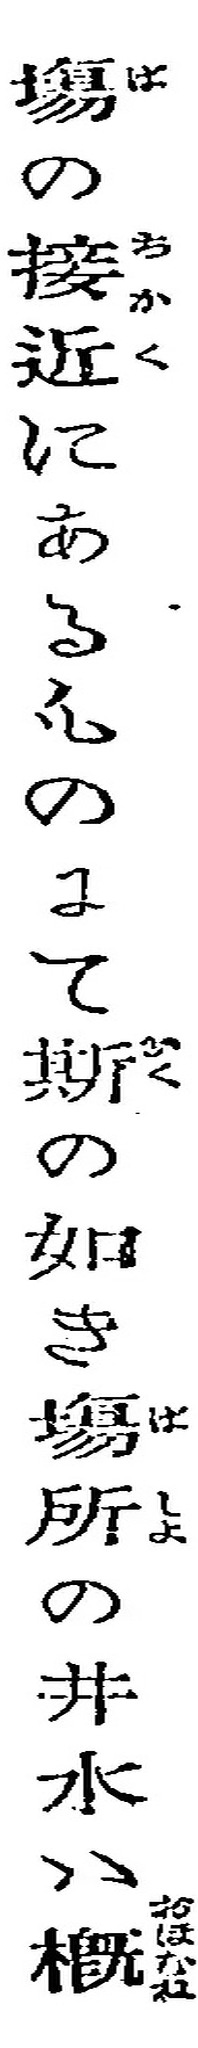場の接近にあるものにて斯の如き場所の井水は概
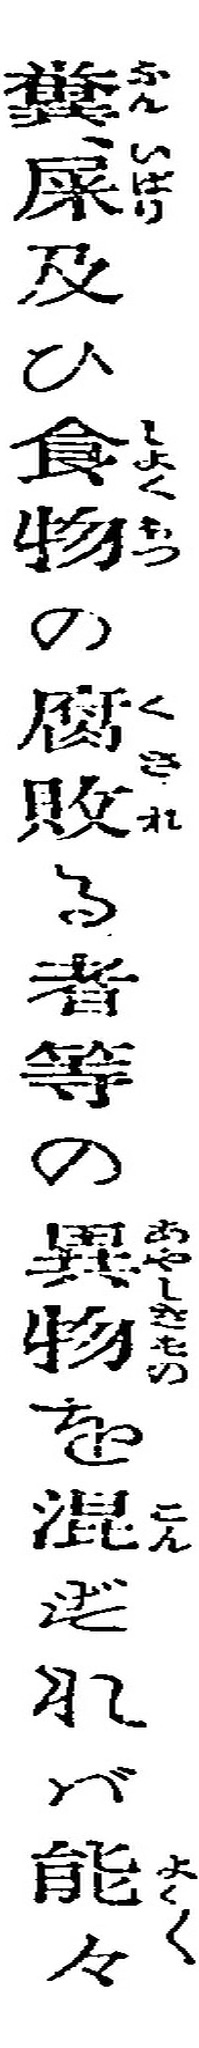糞、尿及ひ食物の腐敗る者等の異物を混ずれば能々
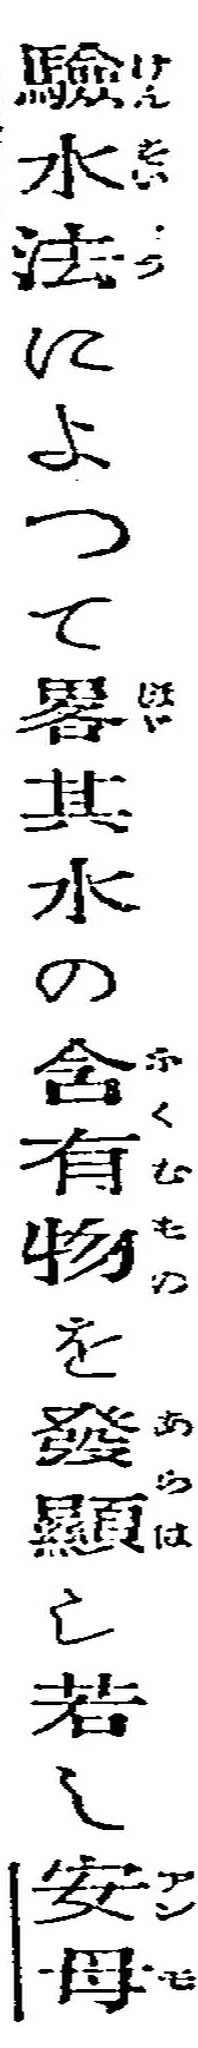験水法によつて畧其水の含有物を発顕し若し安母
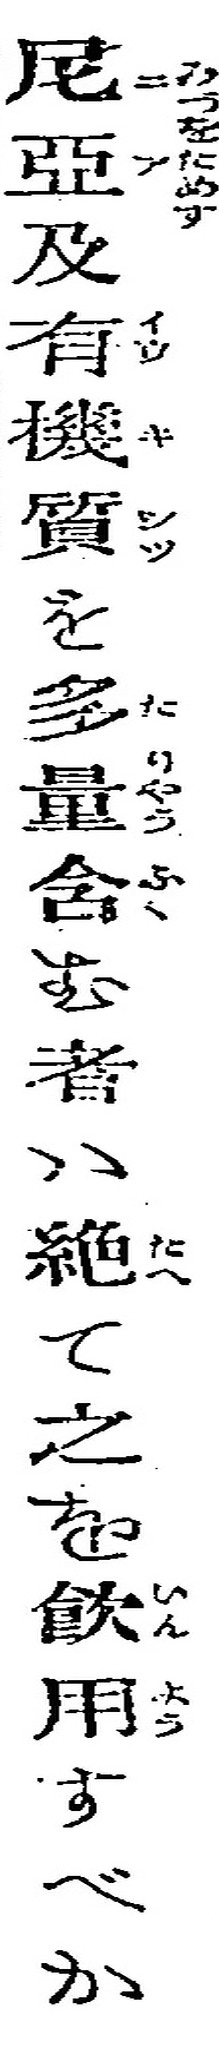尼亞及有機質を多量含む者は絶て之を飲用すべか
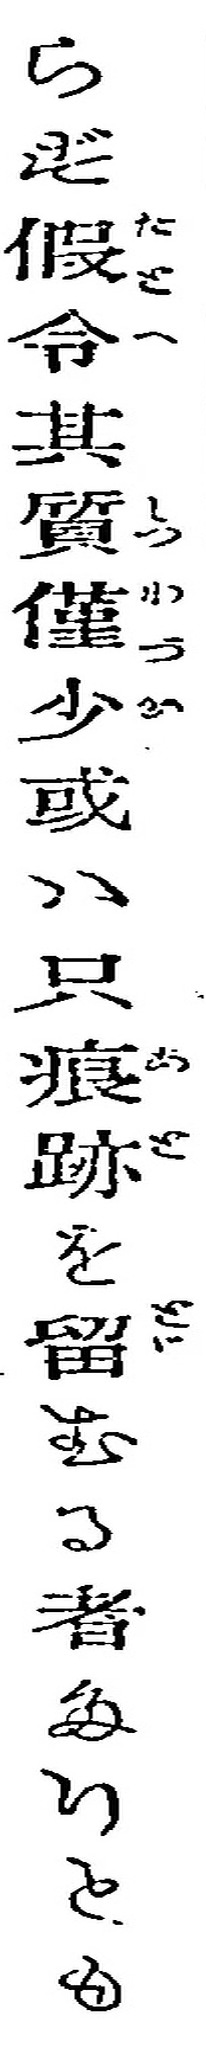らず假令其質僅少或は只痕跡を留むる者たりとも
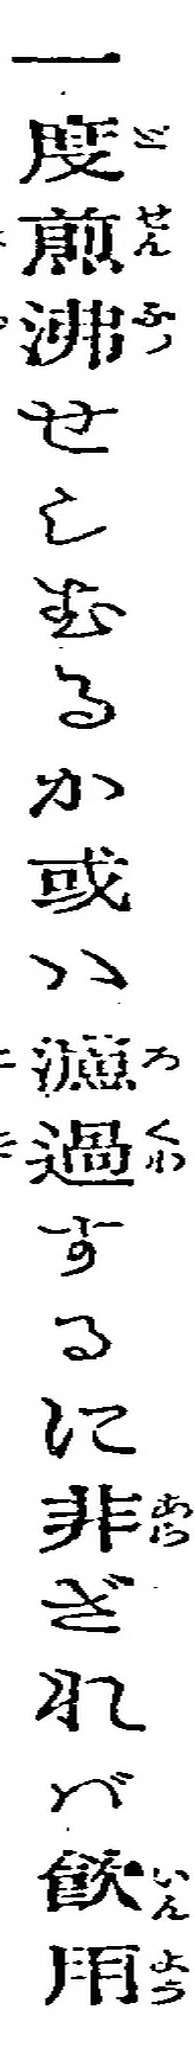一度煎沸せしむるか或は濾過するに非ざれば飲用
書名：飲水の心得 : 伝染病の予防
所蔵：国立国会図書館 National Diet Library, JAPAN
